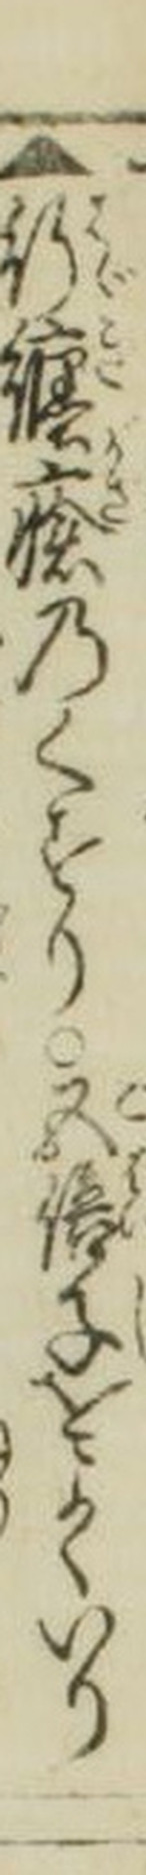▲行纏瘡のくすり◯五倍子をよくいり
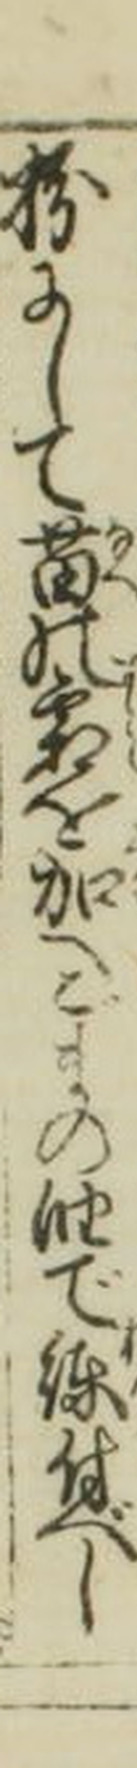粉にして苗の霜を加へごまの油で練付べし
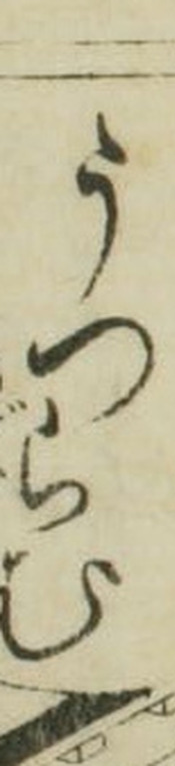うつらむ
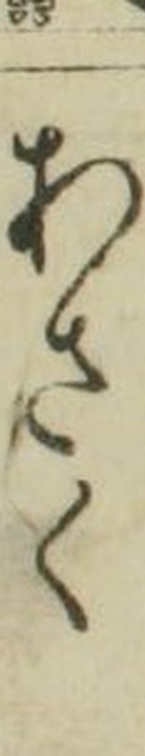あさく
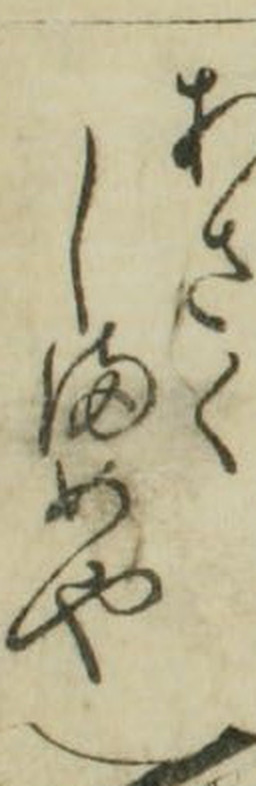しまめや

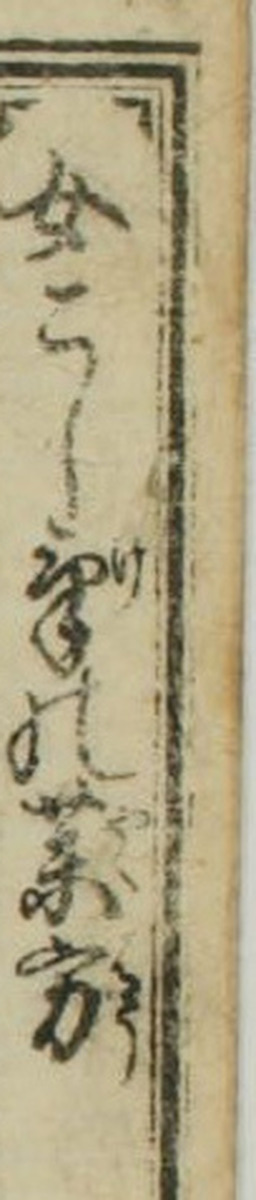「女こし気の薬方
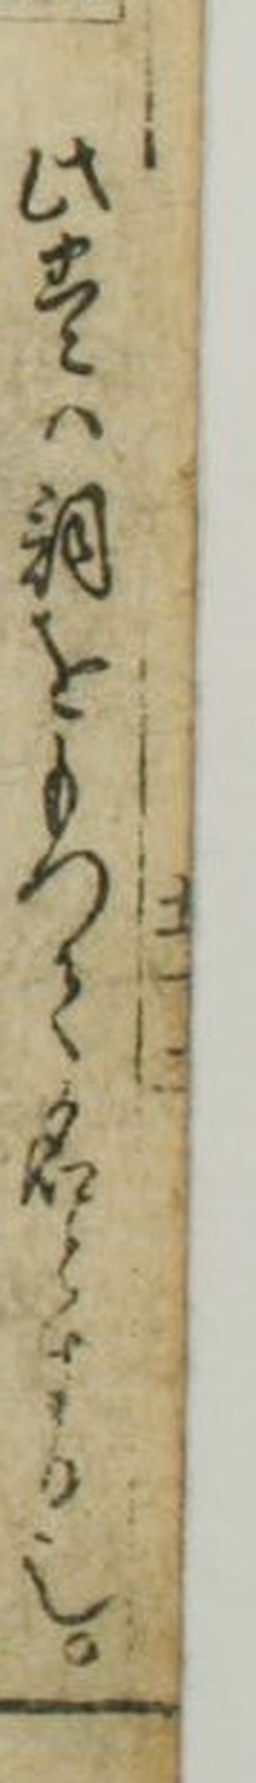此巻は詞をもつて名とする也。
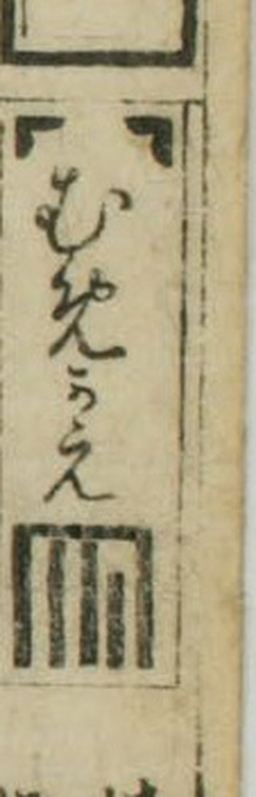「むめかえ
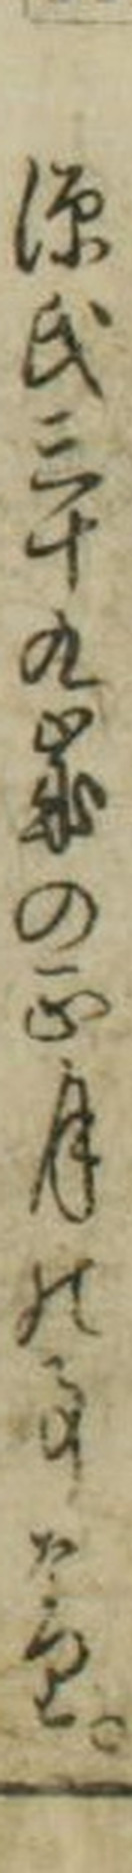源氏三十九歳の正月の事なり。
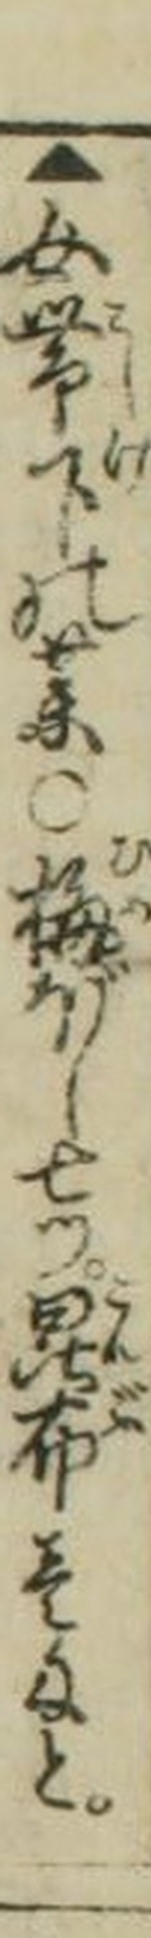▲女帯下の薬◯梅ぼし七ツ。昆布壱匁と。
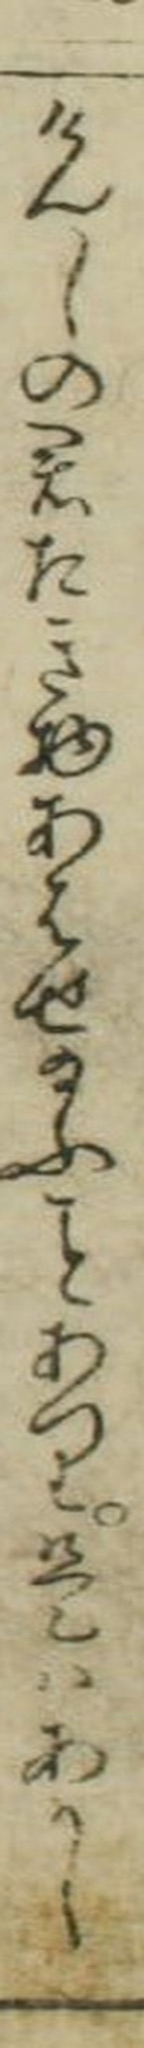けんしの君たき物あはせ給ふことあり。是はあかし
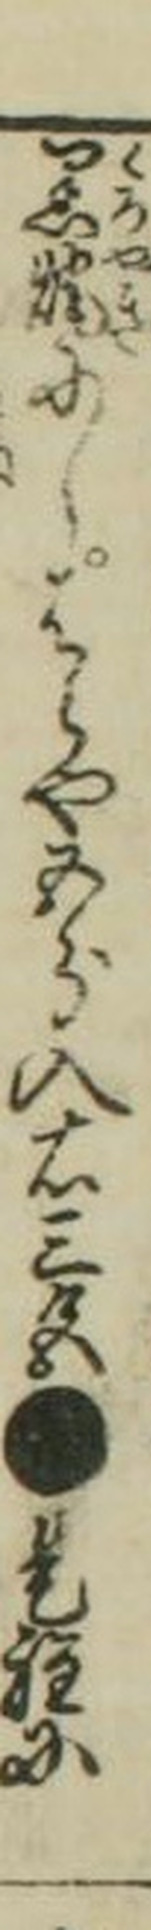黒焼にし。はらや五分入右三色●是程に
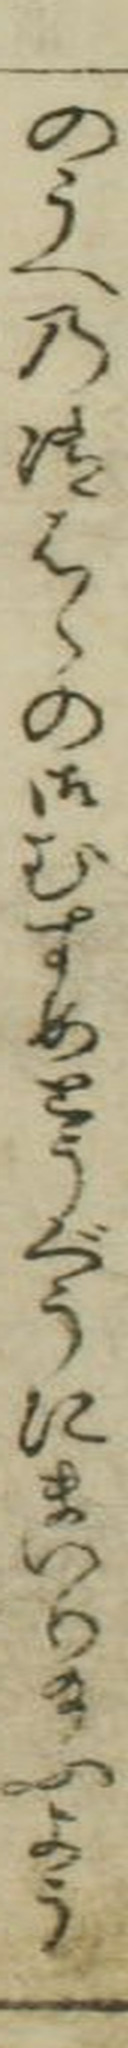のうへの御はゝの御むすめとうぐうにまいり給ふよう
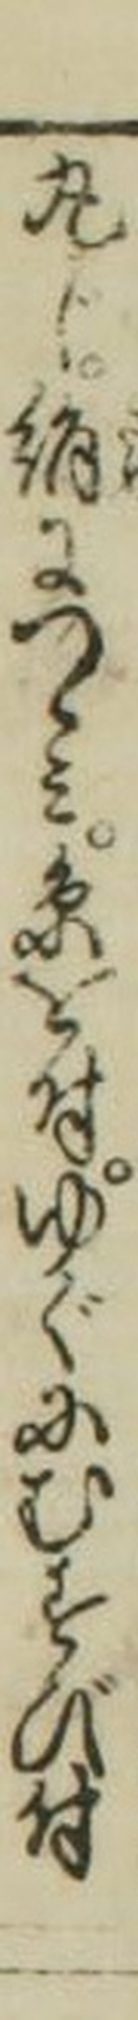丸じ。絹につゝみ。糸を付。ゆぐにむすび付
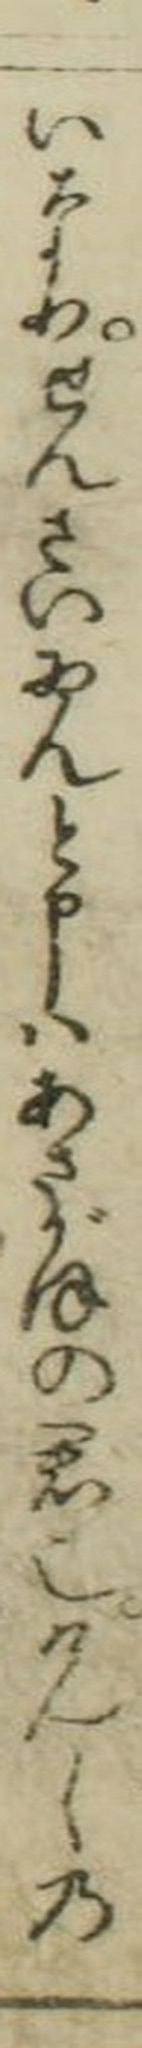いなり。せんさいゐんと申はあさがほの君也。けんしの
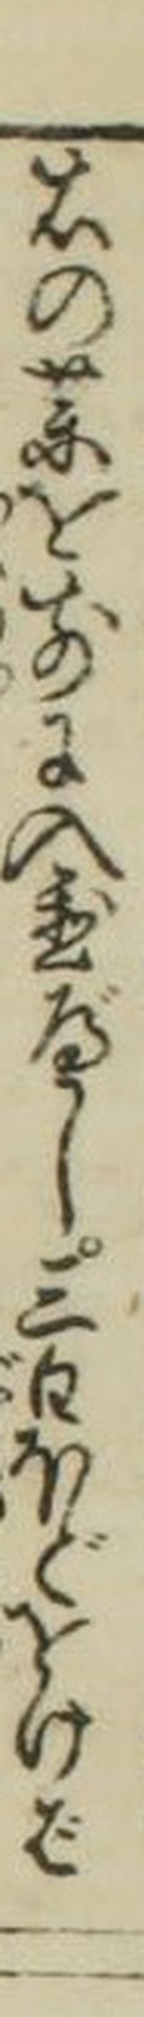右の薬を前に入置べし。三日ほどをけば
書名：女源氏教訓鑑
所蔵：東京学芸大学附属図書館
